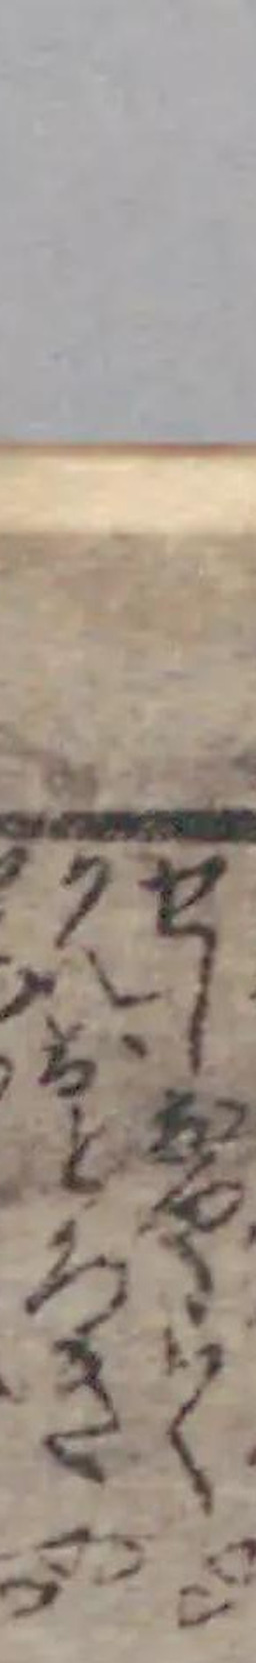かんおとろき
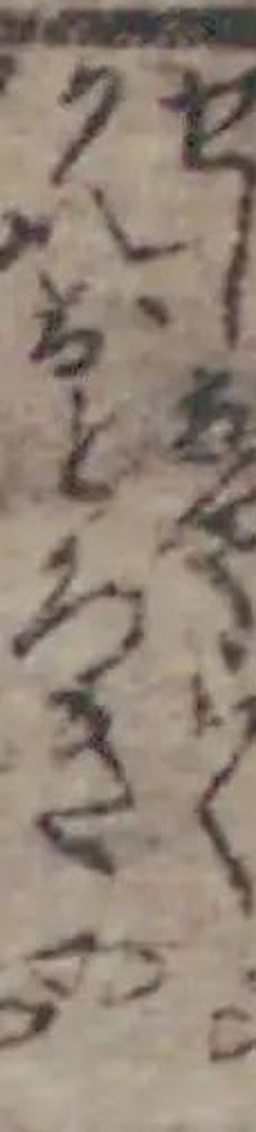かんおとろき
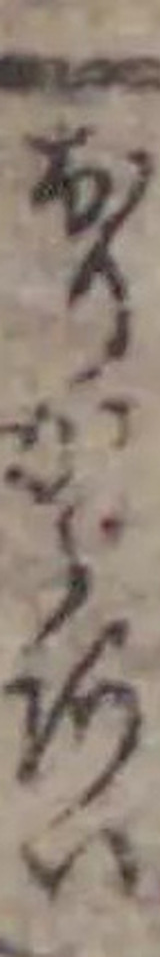おりからあい
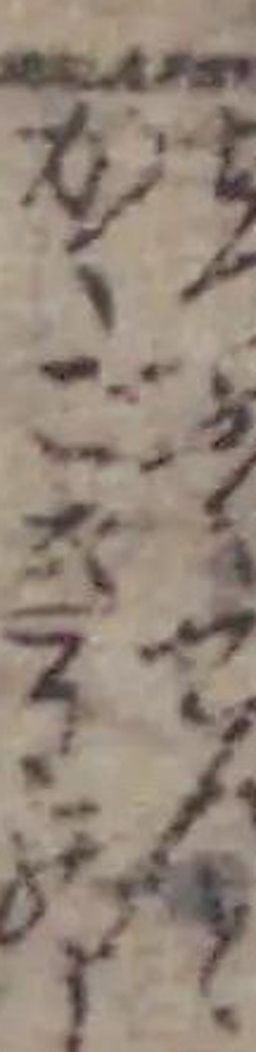かくごきわめし
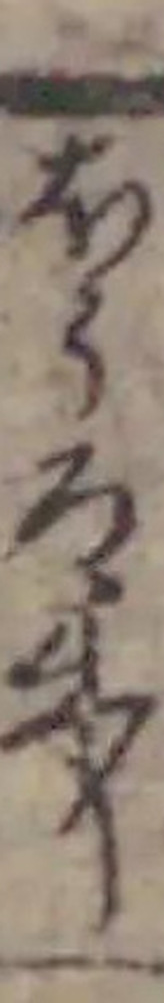ほうろ来り
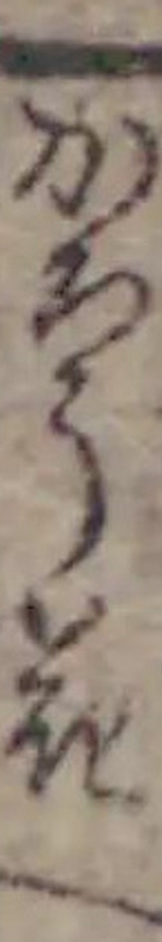かろう花
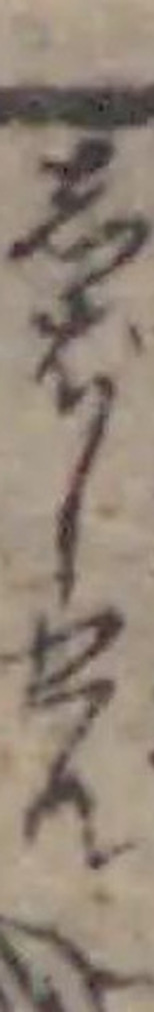しばしせん
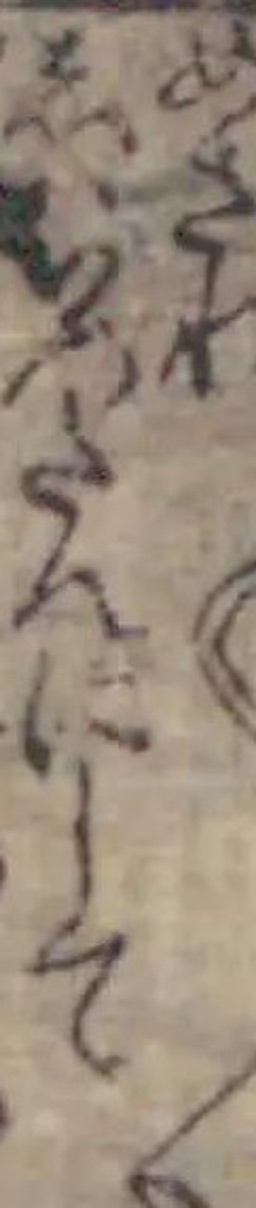しはいつたんにして
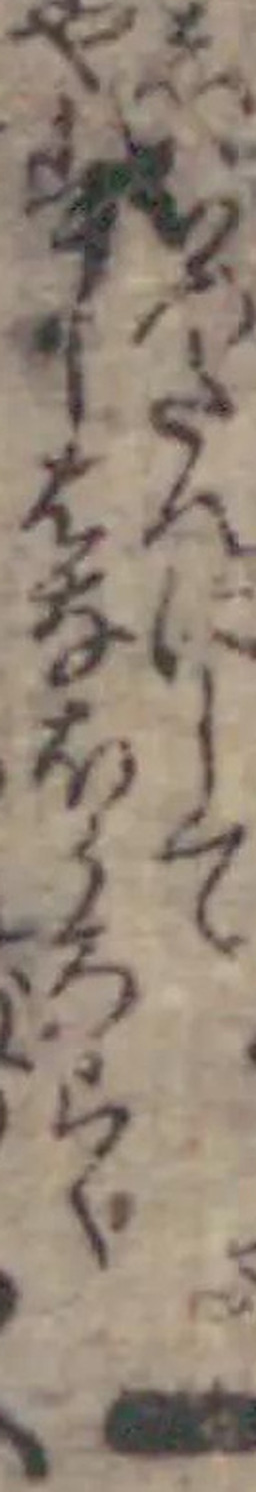やはなほうろらく
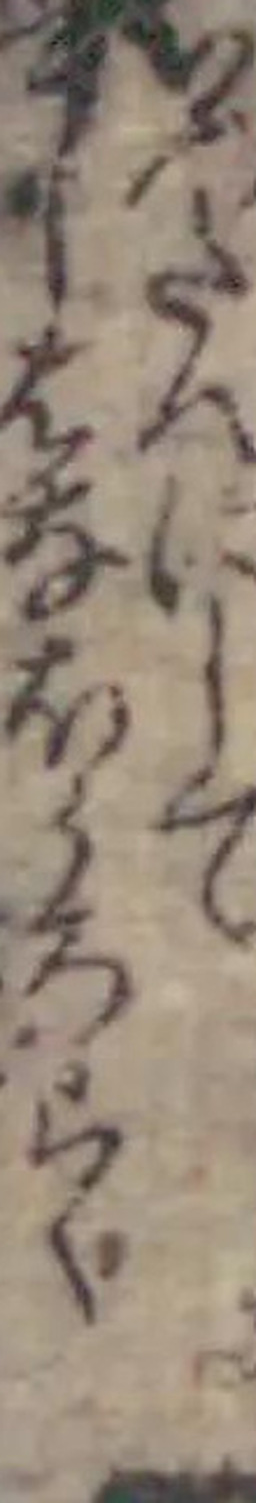やはなほうろらく
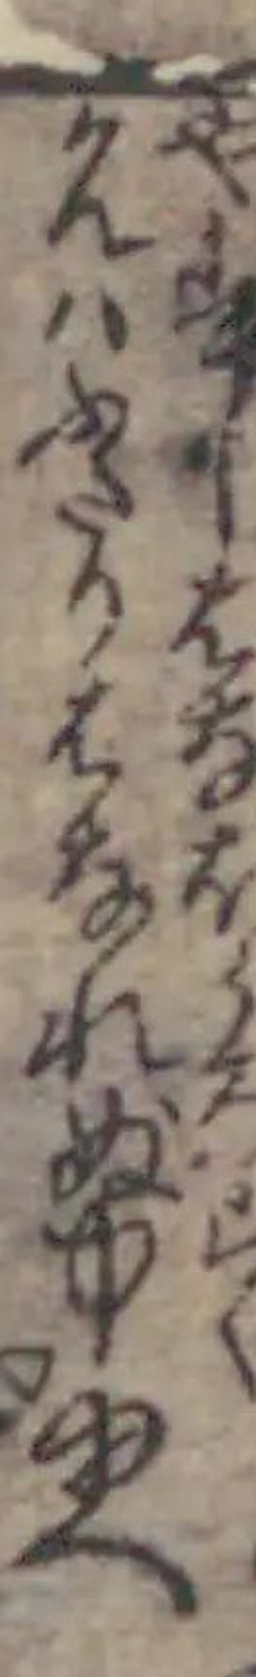かんはふたりはなれぬ中ゆへ
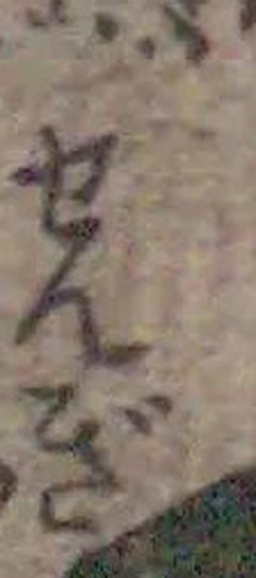せんぎ

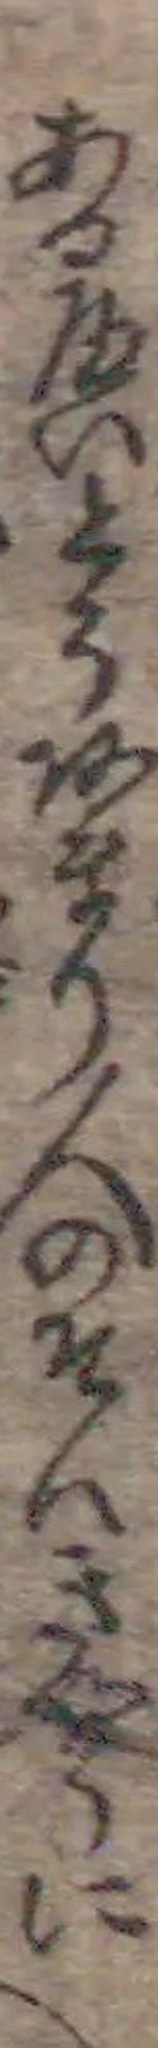あるへいとうあまり人のそんきうに
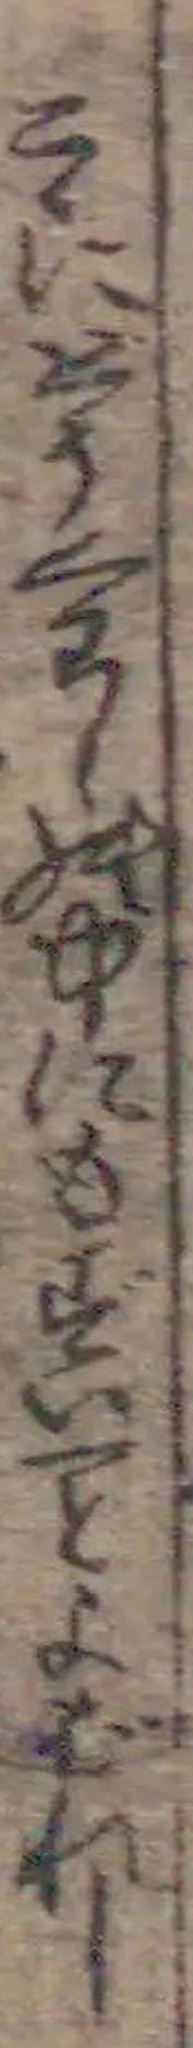こゝにとうくわしの中にもずい一とよばれし
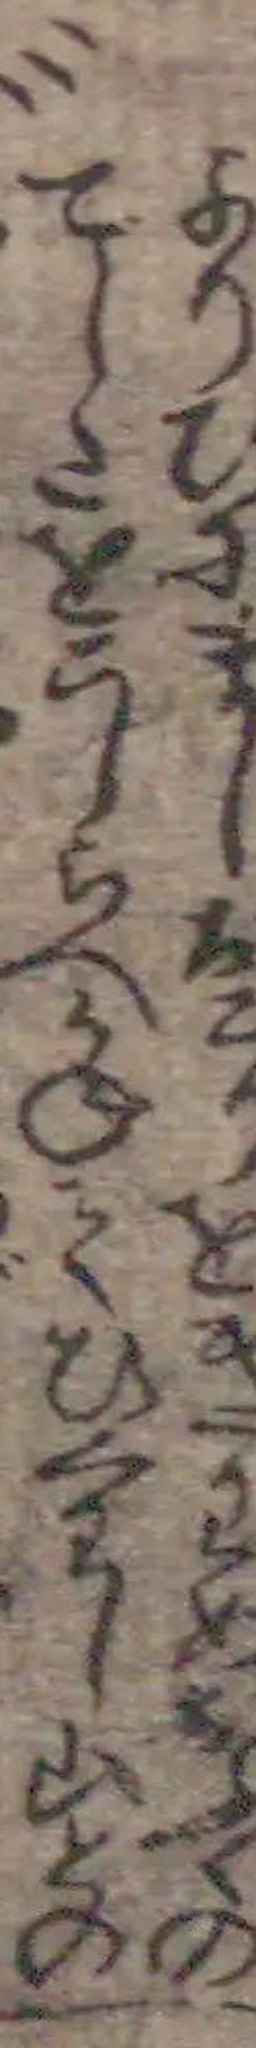てしたをこしらへかねてひくわし山殿
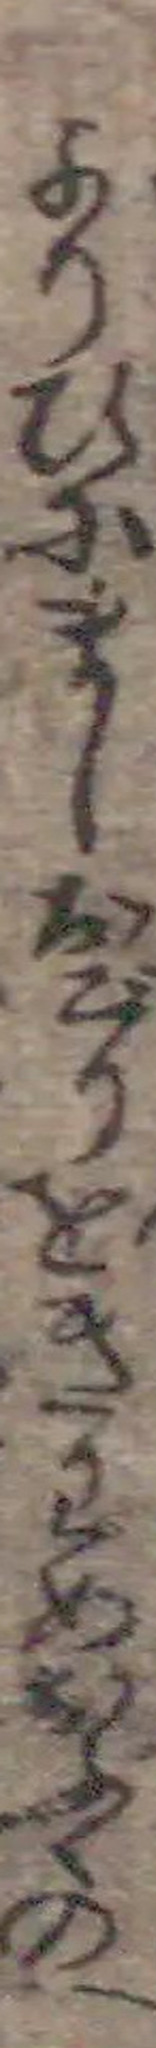よりひにましおごりをきわめおふくの
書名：名代干菓子山殿 3巻
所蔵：国立国会図書館 National Diet Library, JAPAN
